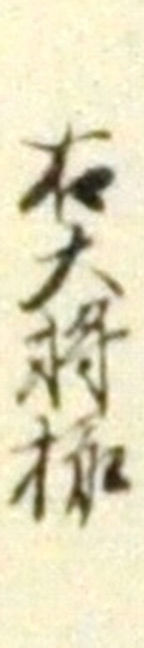右大将様
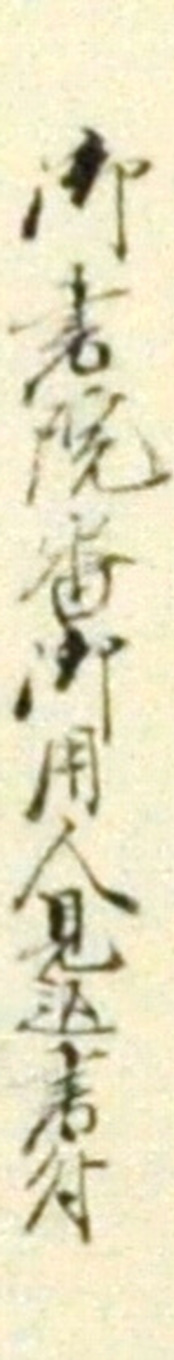御書院番御用人見込書付
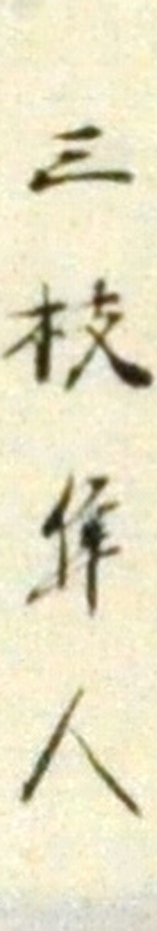三枝隼人
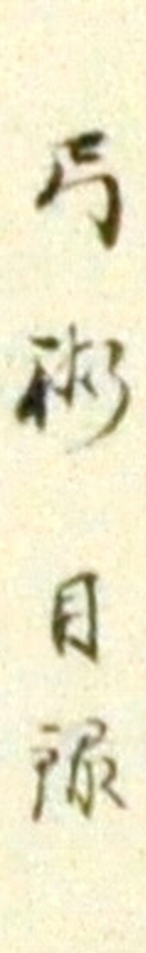弓術目録
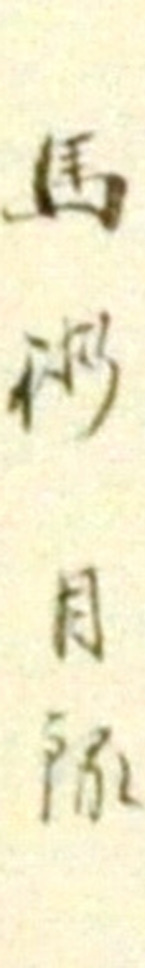馬術目録
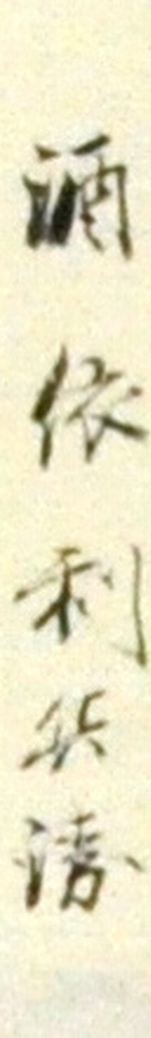酒依利兵衛
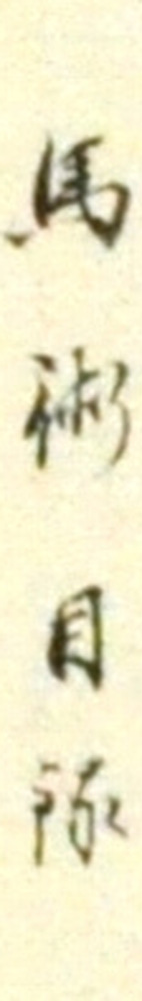馬術目録
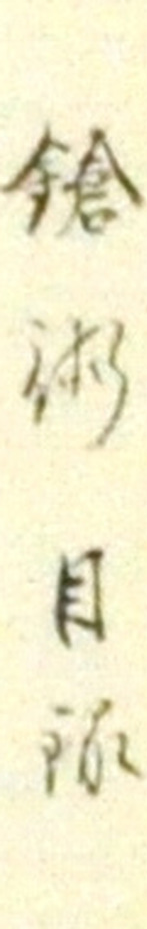鎗術目録
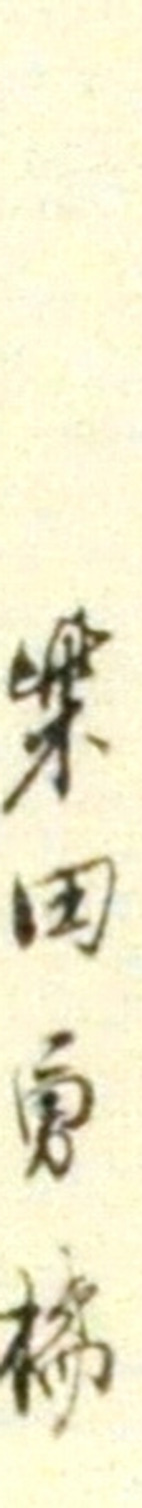柴田勇橘
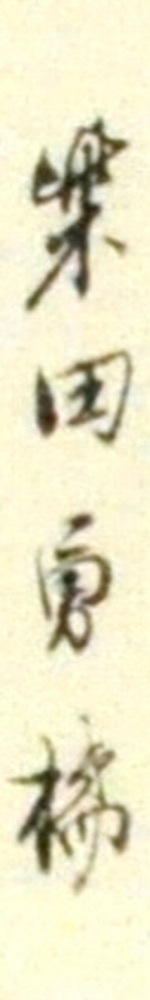柴田勇橘
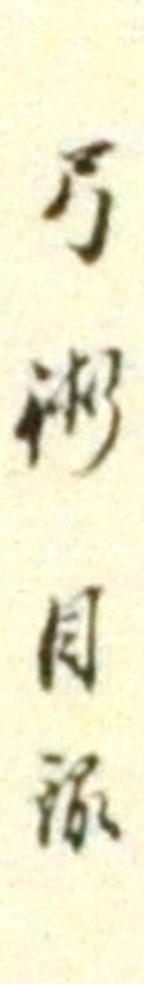弓術目録
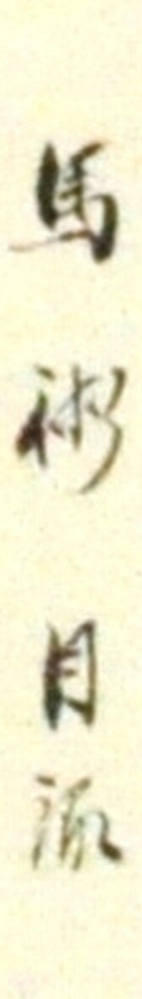馬術目録
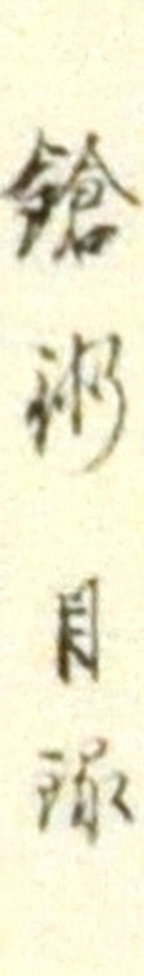鎗術目録
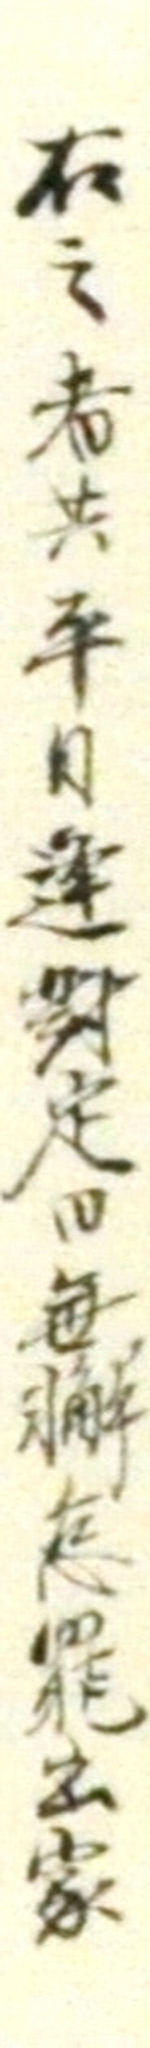右之者共平日逢対定日無懈怠罷出家
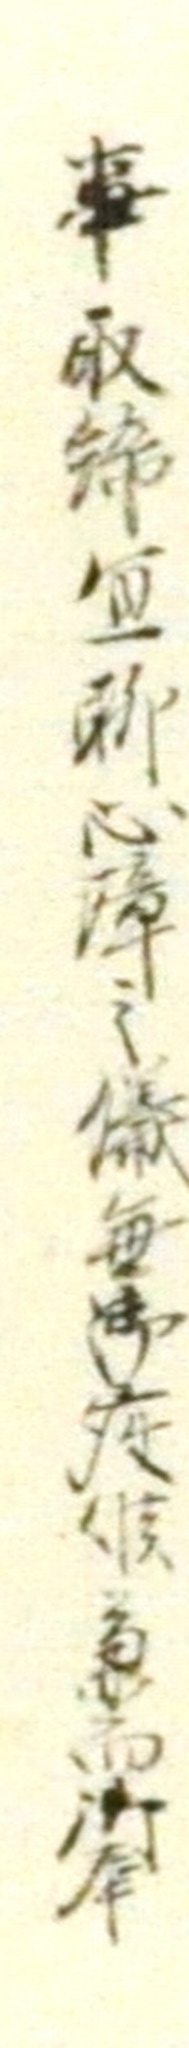事取締宜聊心障之儀無御座候兼而御奉
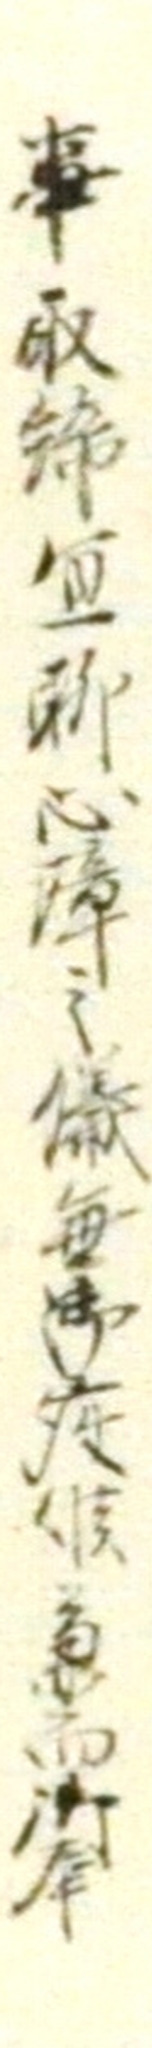事取締宜聊心障之儀無御座候兼而御奉
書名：右大将様御書院番見込書付
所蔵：伊那市立高遠町図書館・合同会社AMANE
